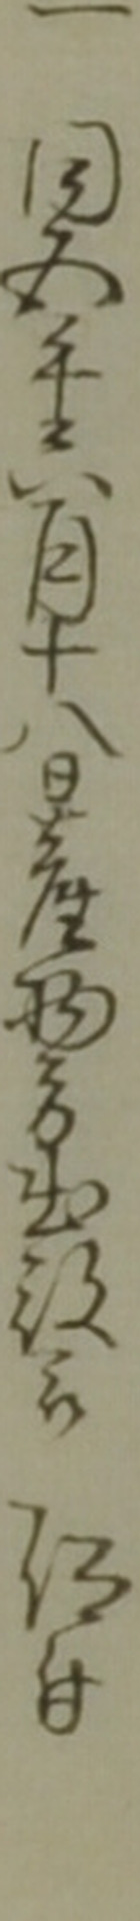一同五午六月十八日産物方出役被仰付
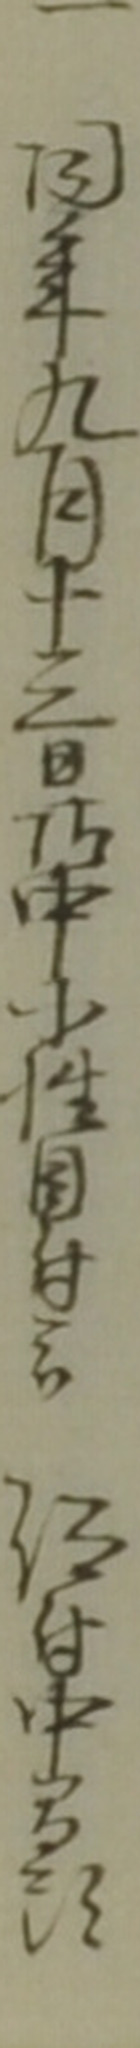一同年九月十三日御中小性目付被仰付中間頭
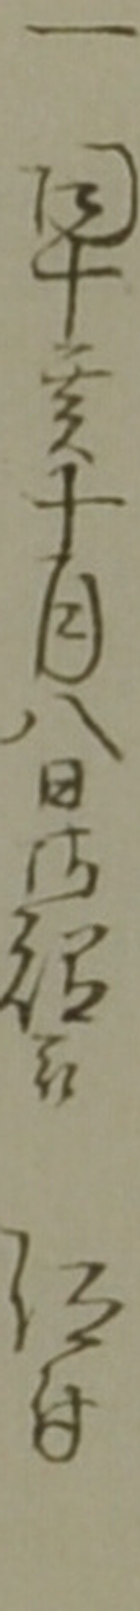一同十亥十月八日御賄被仰付
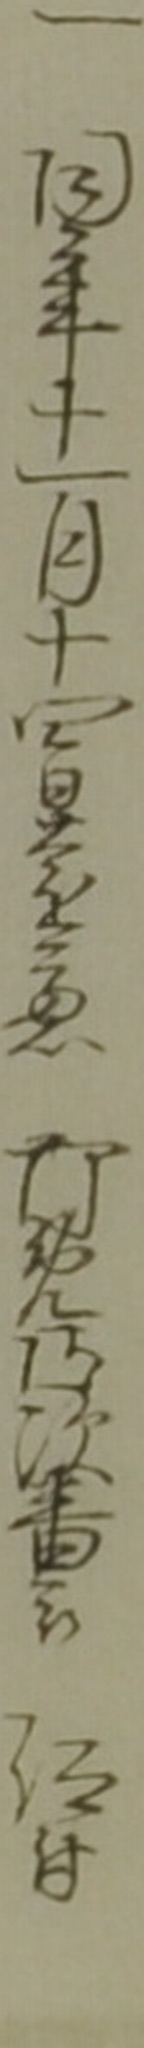一同年十一月十四日遠慮御免御次番被仰付
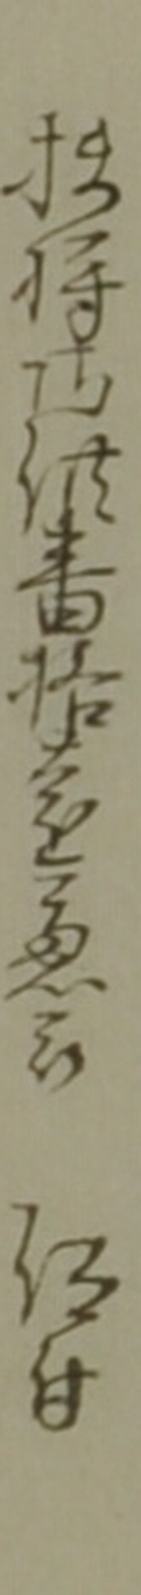扶持御供番格遠慮被仰付
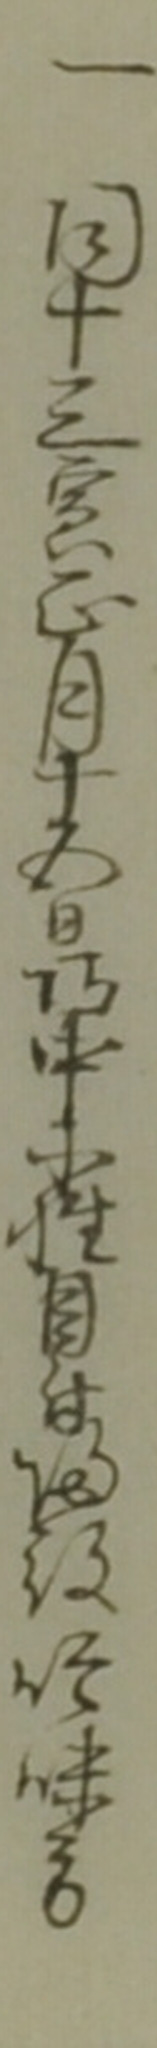一同十三寅正月十五日御中小性目付帰役吟味方
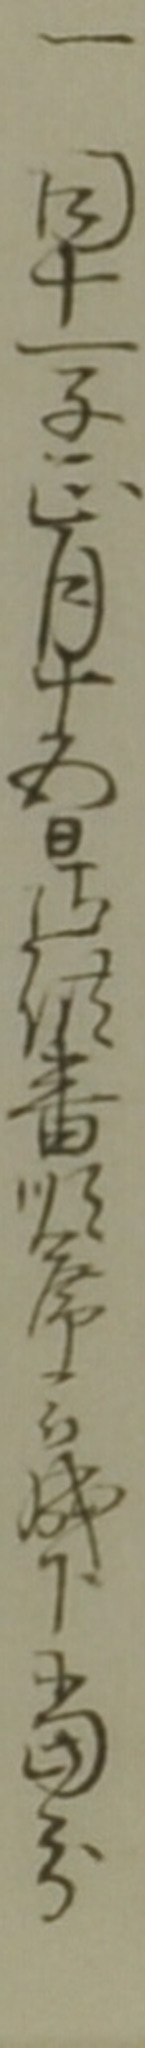一同十一子正月十五日御供番順席被成下当分
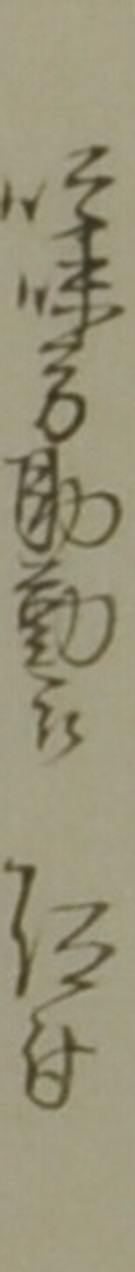吟味方助勤被仰付
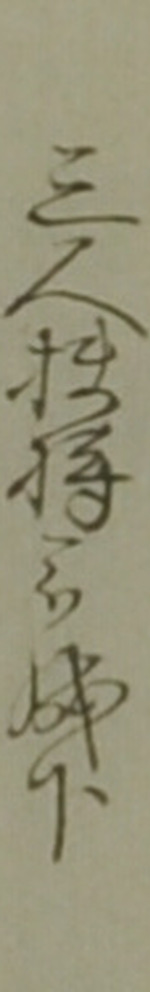三人扶持被成下
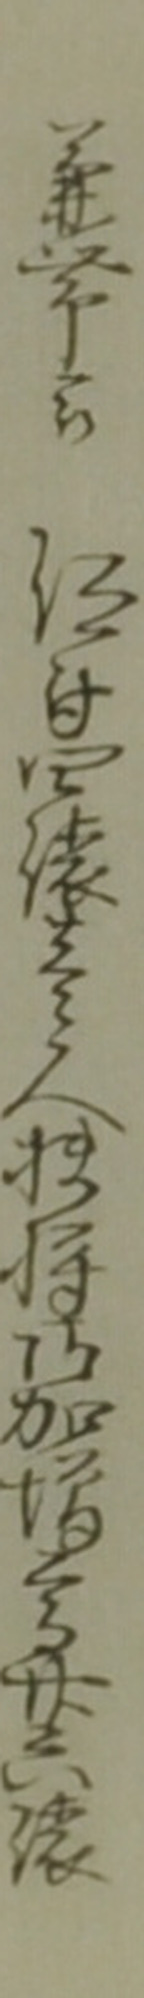兼帯被仰付四俵壱人扶持御加増高あ廿六俵
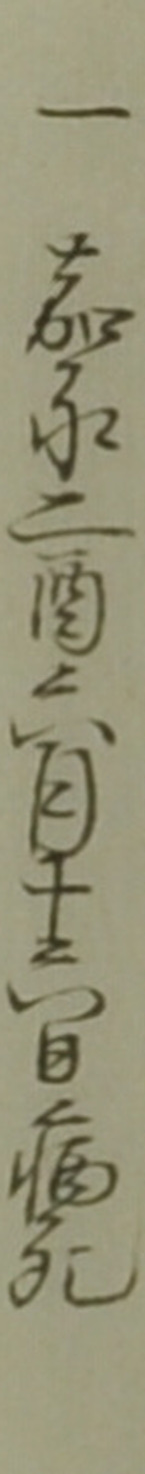一嘉永二酉六月十六日病死
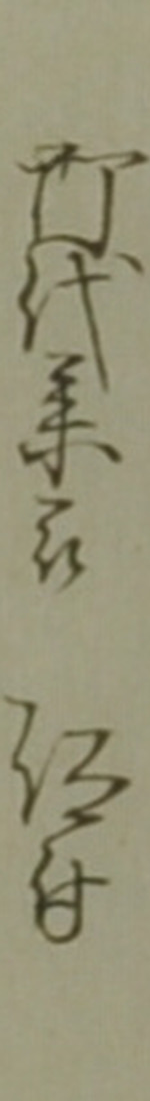御代参被仰付

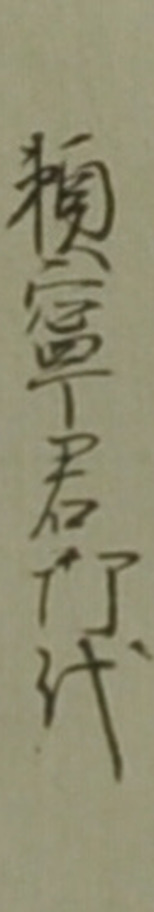頼寧君御代
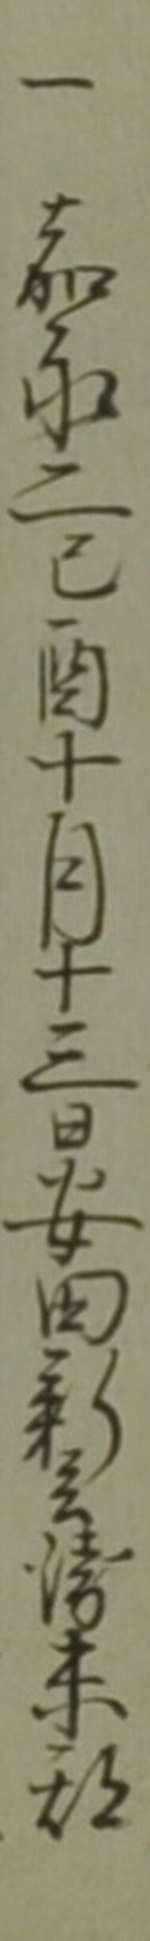一嘉永二己酉十月十三日安田新兵衛末期
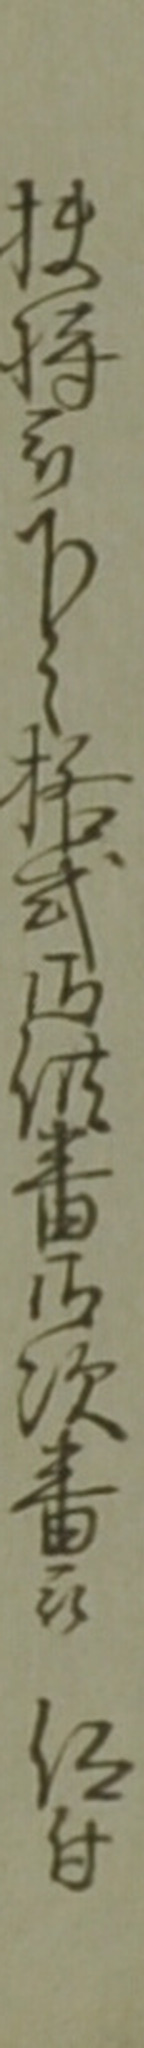扶持被下之格式御供番御次番被仰付
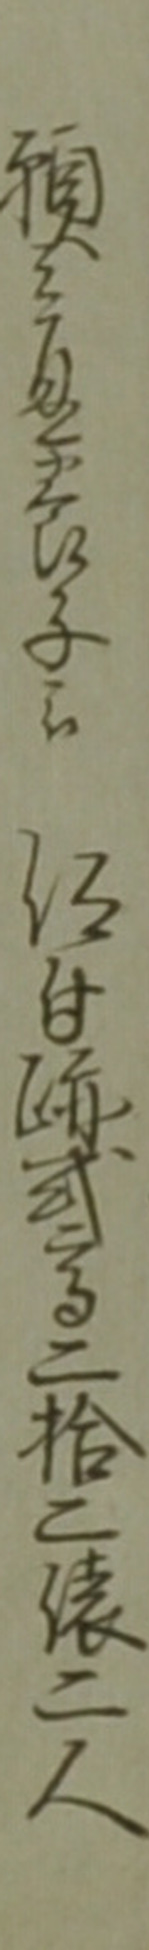願之通養子被仰付跡式高二拾二俵二人
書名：無足諸士勤仕録（一）
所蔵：伊那市立高遠町図書館・合同会社AMANE
